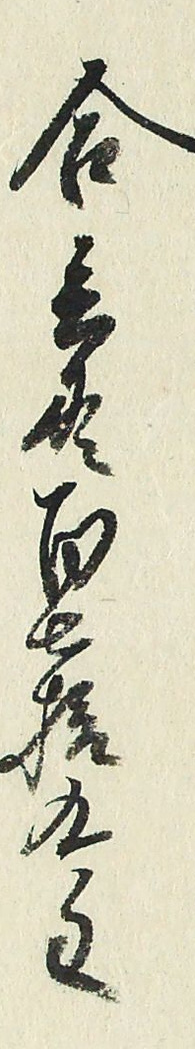合一貫百七十九匁

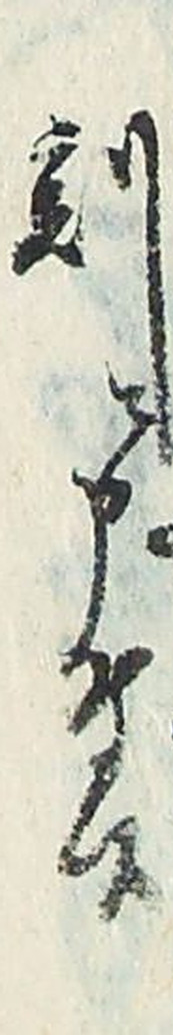割に申付候
